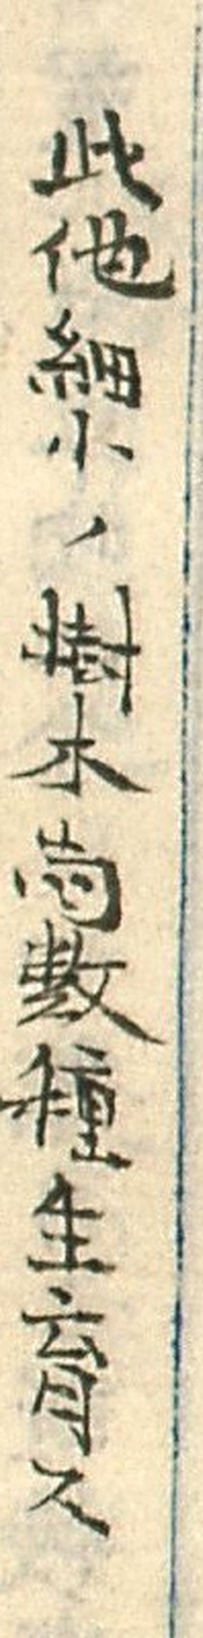此他細小ノ樹木尚数種生育ス
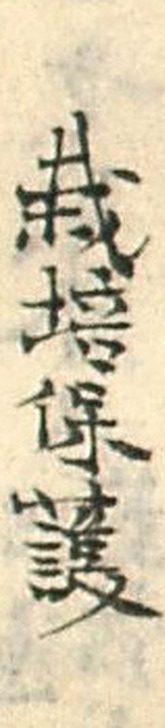栽培保護
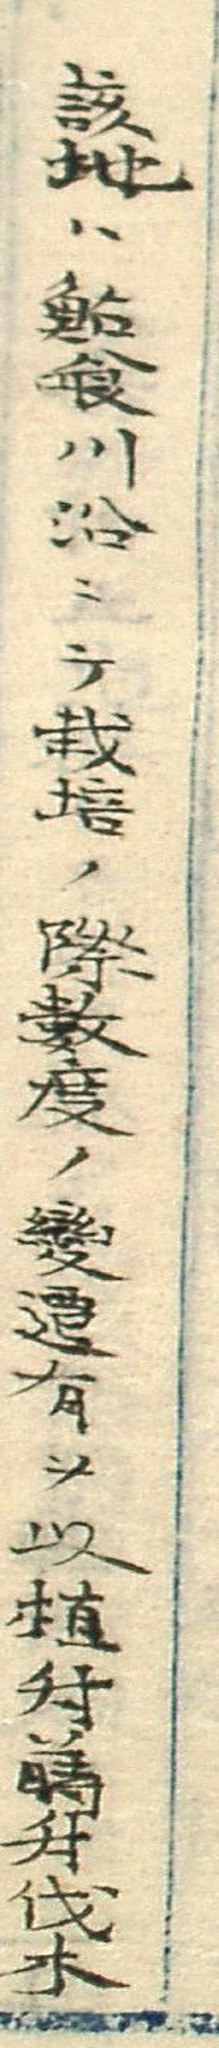該地ハ鮎喰川沿ニテ栽培ノ際数度ノ変遷有ヲ以植付蒔付伐木
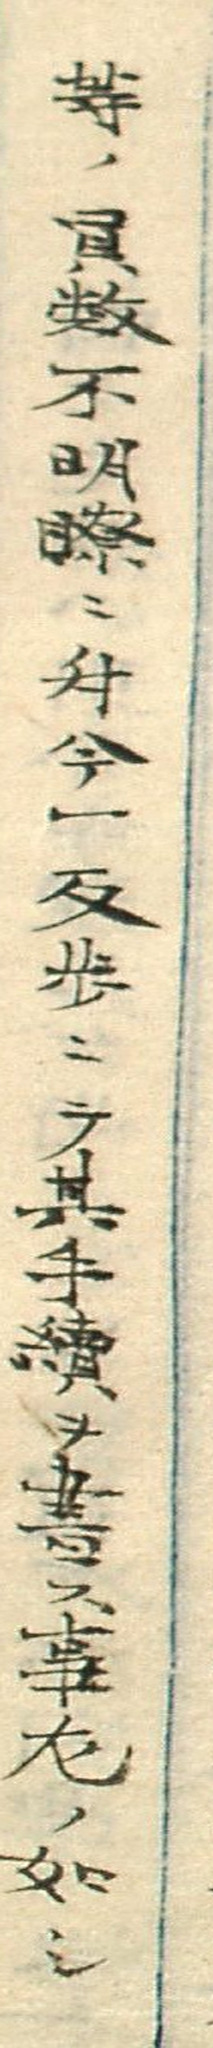等ノ員数不明瞭ニ付今一反歩ニテ其手続ヲ書ス事左ノ如シ
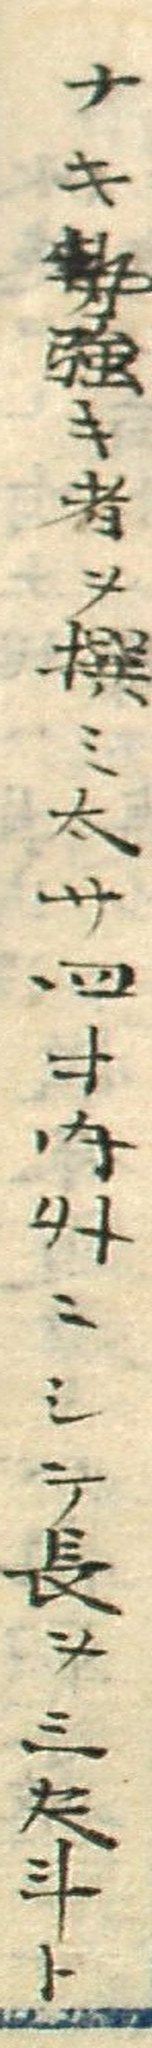ナキ勢強キ者ヲ撰ミ太サ四寸内外ニシテ長ヲ三尺斗ト

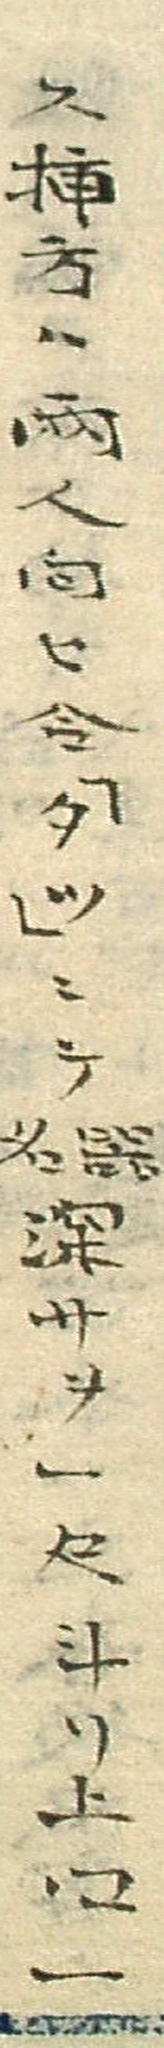ス挿方ハ両人向ヒ合「タツ」ニテ器名深サヲ一尺斗リ上口一
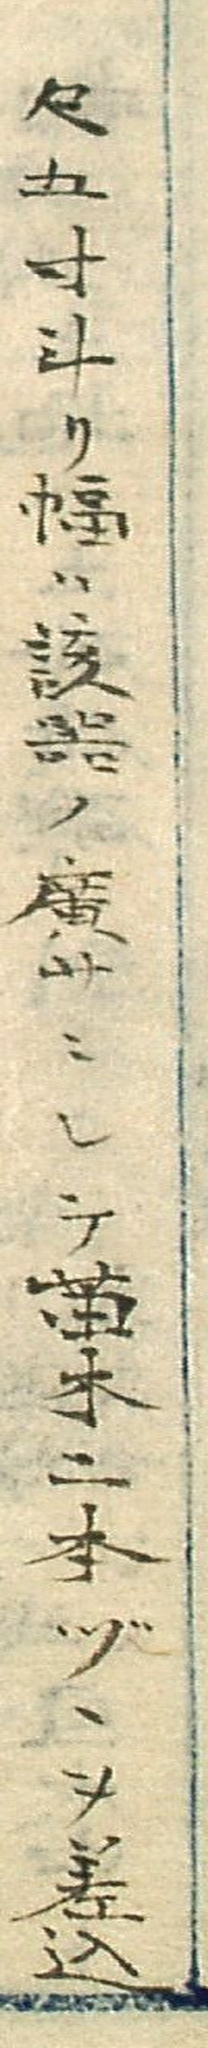尺五寸斗リ幅ハ該器ノ広サニシテ苗木二本ヅヽヲ差込
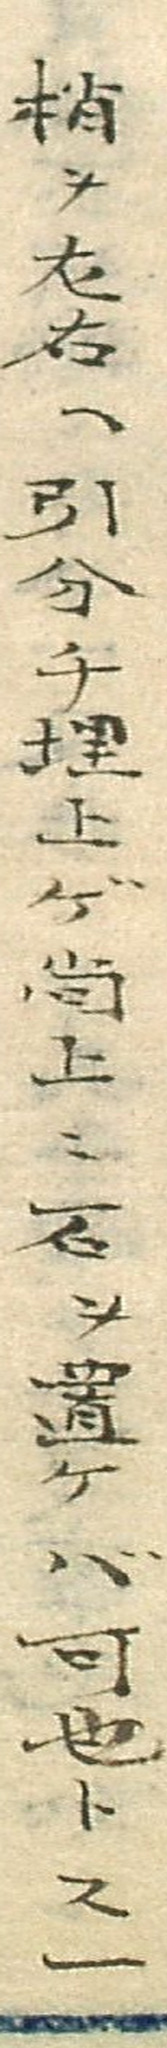梢ヲ左右ヘ引分チ埋上ゲ尚上ニ石ヲ置ケバ可也トス一
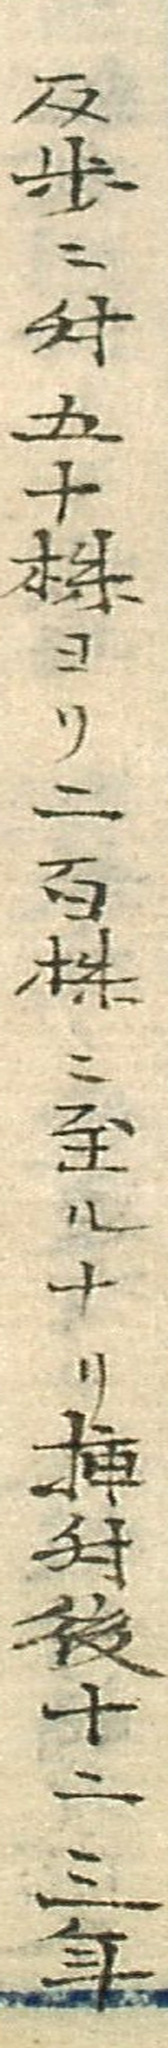反歩ニ付五十株ヨリ二百株ニ至ルナリ挿付後十二三年
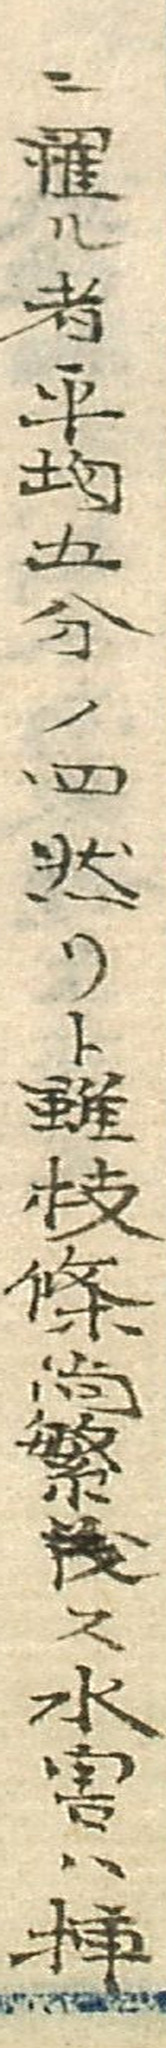ニ罹ル者平均五分ノ四然リト雖枝条尚繁茂ス水害ハ挿
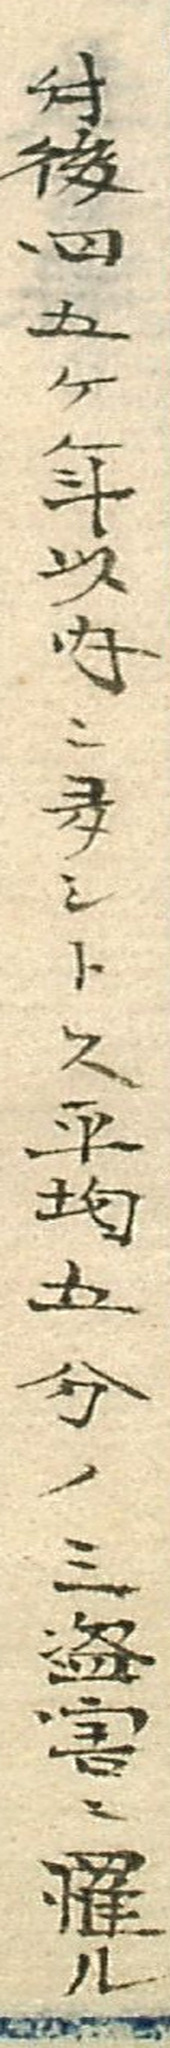付後四五ヶ年以内ニ多シトス平均五分ノ三盗害ニ罹ル
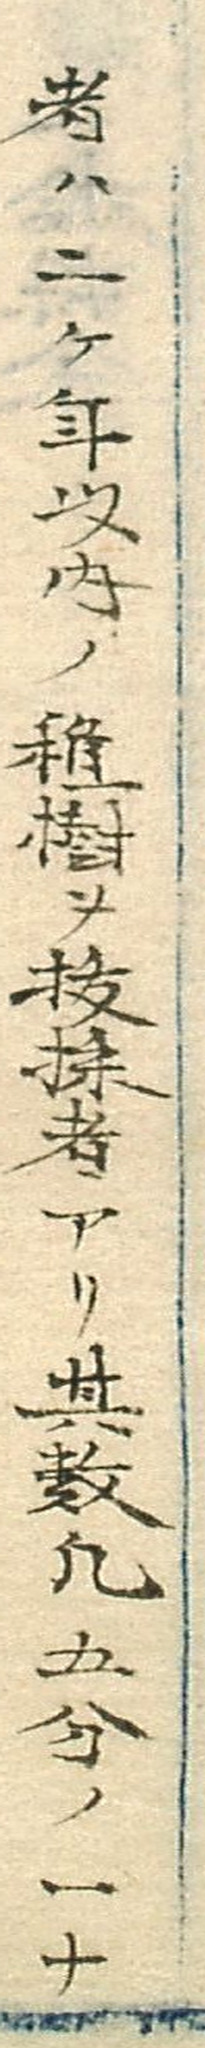者ハ二ヶ年以内ノ稚樹ヲ抜採者アリ其数凡五分ノ一ナ
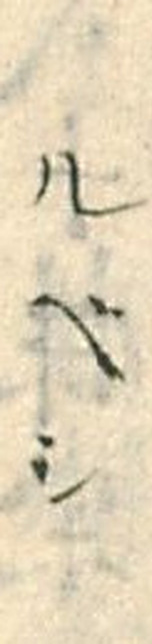ルベシ
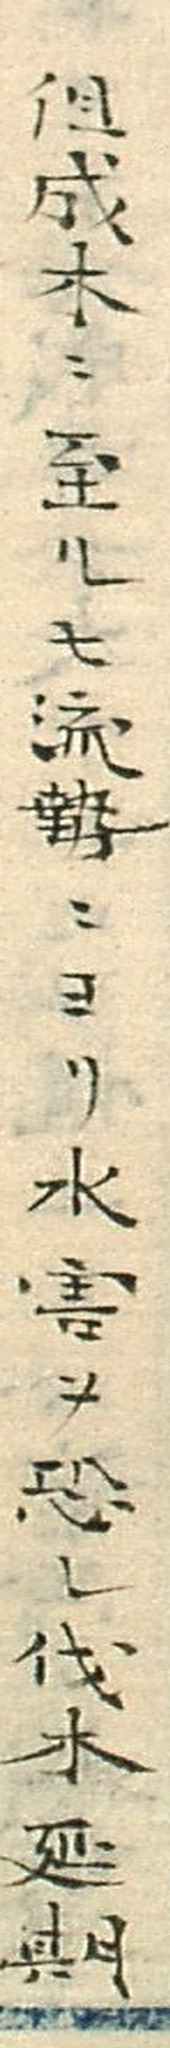但成木ニ至ルモ流勢ニヨリ水害ヲ恐レ伐木延期
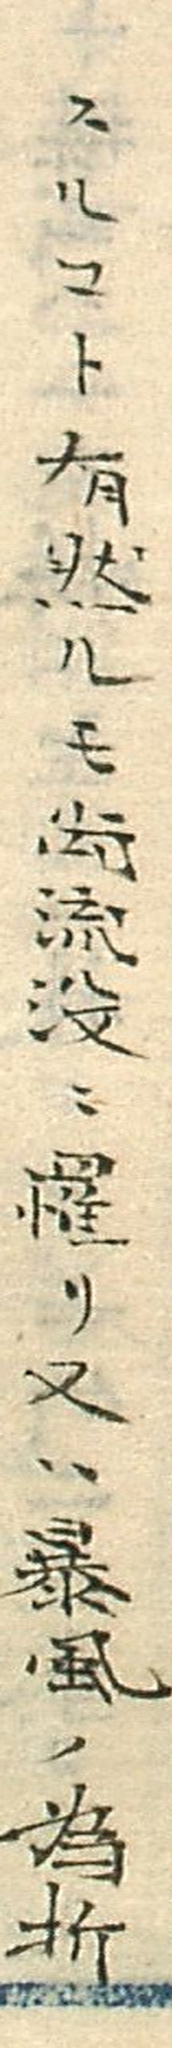スルコト有然ルモ尚流没ニ罹リ又ハ暴風ノ為折
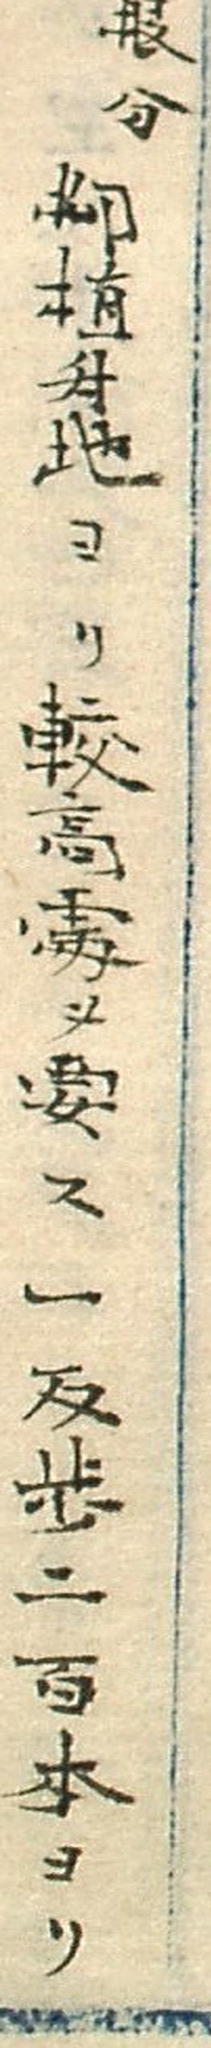茱萸根分柳植付地ヨリ較高処ヲ要ス一反歩二百本ヨリ
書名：山林共進会取調書
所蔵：鳴門教育大学 Naruto University of Education
